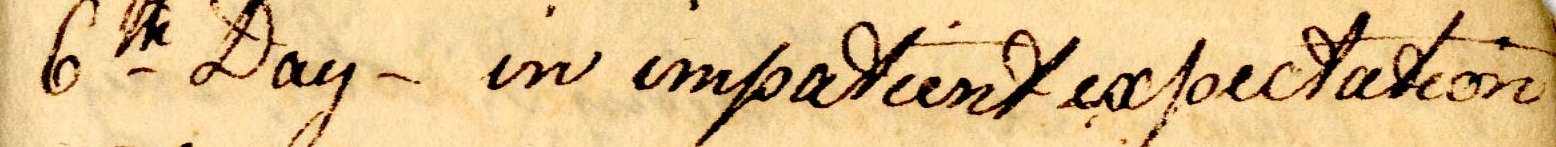6^th Day- in impatient expectation
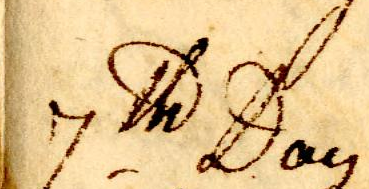7^th Day
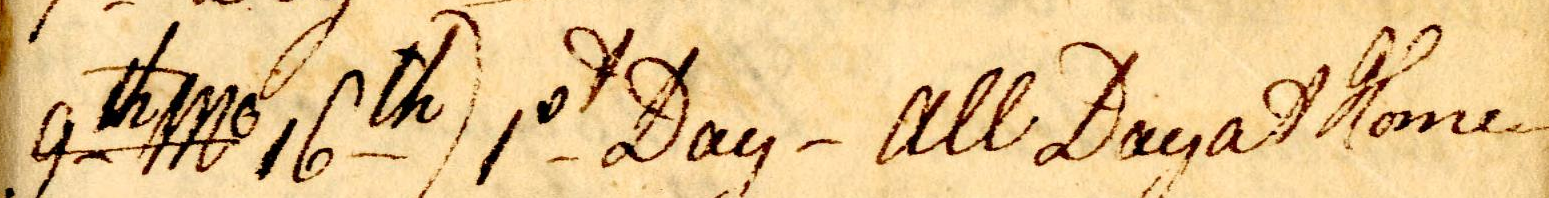9^th M^o 16^th) 1^st Day- All Day at Home
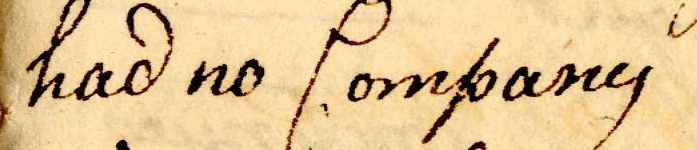had no Company
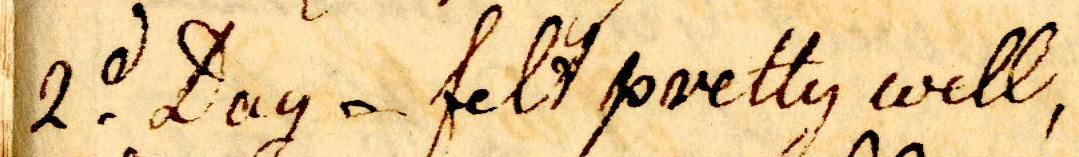2^d. Day- felt pretty well.
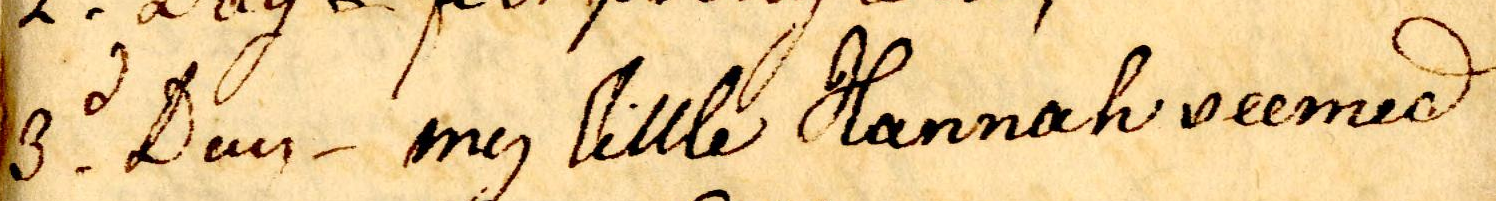3^d. Day- my little Hannah seemed
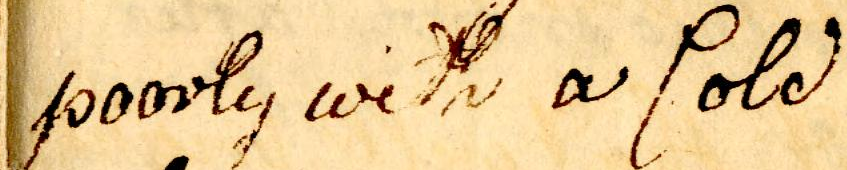poorly with a Cold
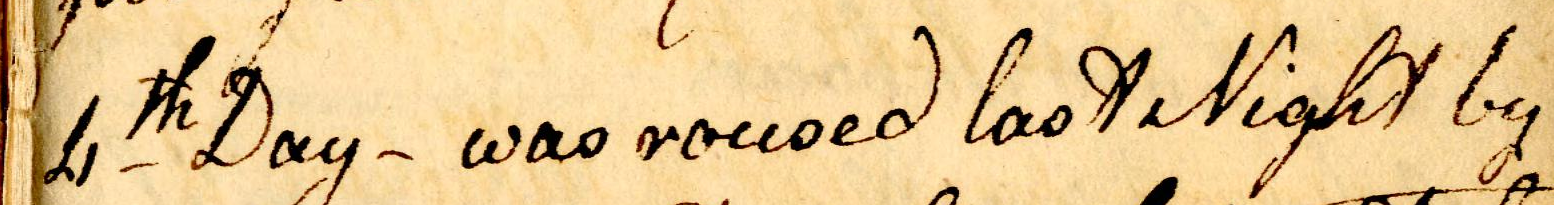4^th Day- was roused last Night by
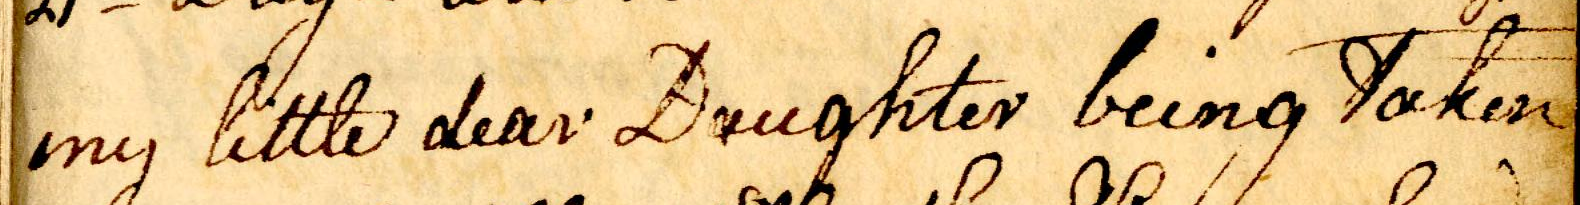my little dear Daughter being taken
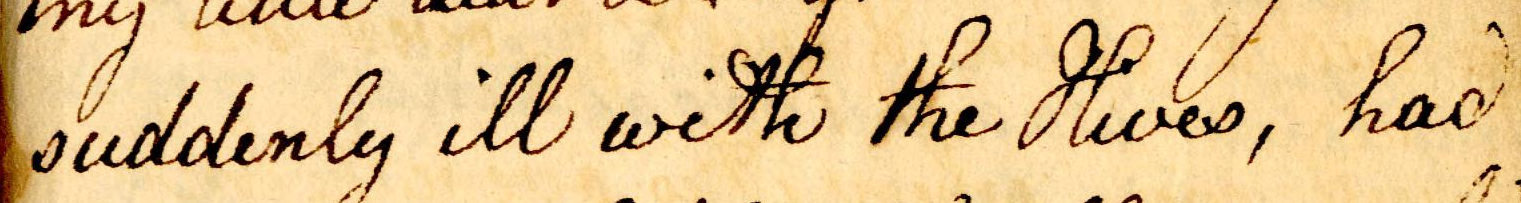suddenly ill with the Hives, had
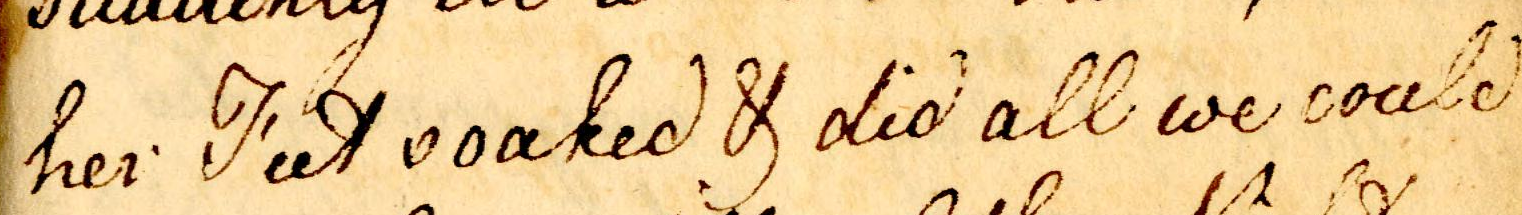her Feet soaked & did all we could
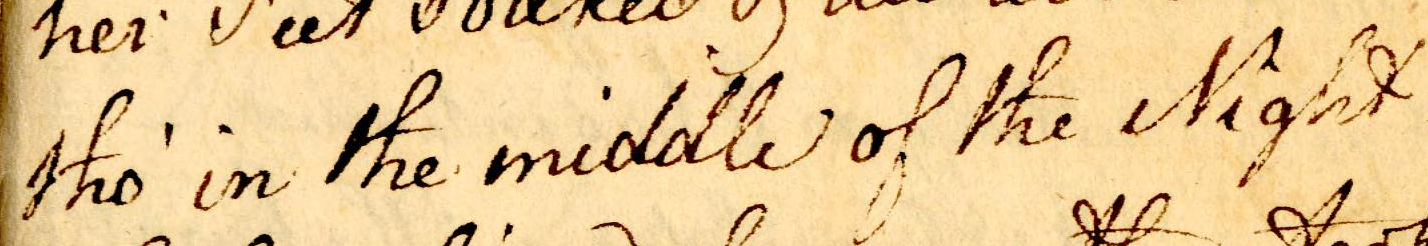tho' in the middle of the Night
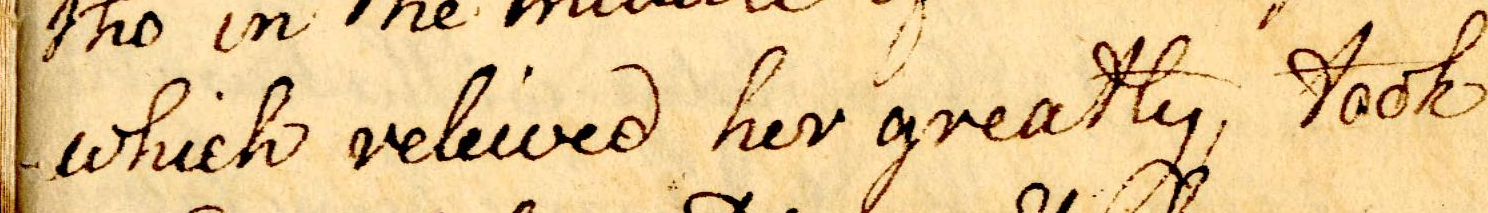which releived her greatly, took
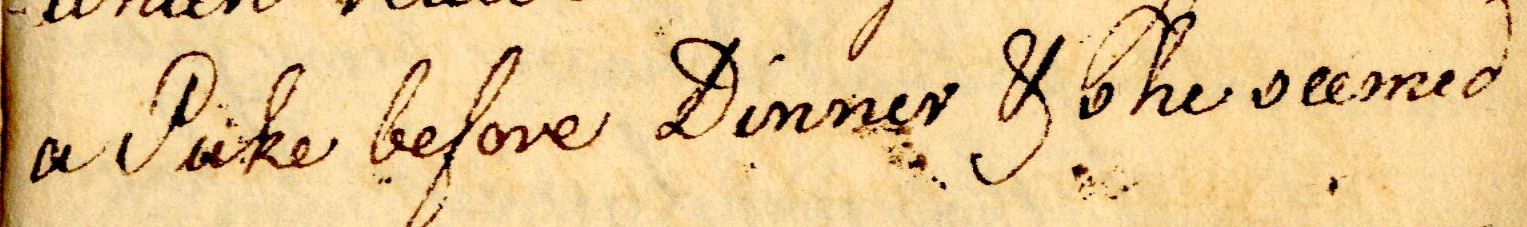a Puke before Dinner & she seemed
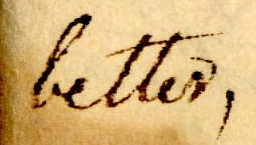better,
